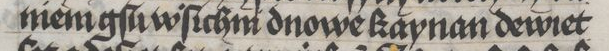níeni gſu wẛichní dnowe kaynan dewiet
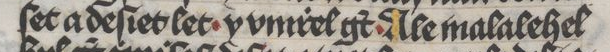ſet a deſiet let.y vmṙel ḡt. Ale malalehel
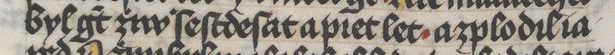byl ḡt żiw ẛeſtdeſat a piet let.a zplodil ía¬
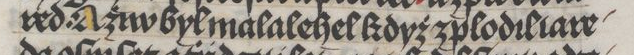red.A żiw byl malalehel když zplodil iare¬
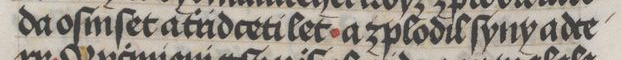da oſmſet a tṙidcetí let.a zplodil ſyny a dce¬
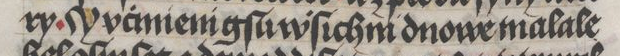ry.Y vċiniení gſu wẛichni dnowe malale¬
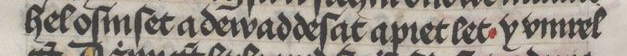hel oſm ſet a dewaddeſat a piet let.y vmrel
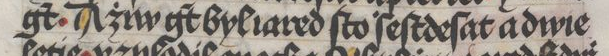ḡt. A żiw ḡt byl iared ſto ẛeſtdeſat a dwie
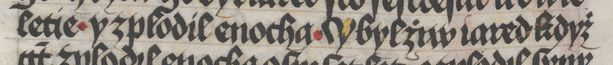letíe.y zplodíl enocha.Y byl żiw iared kdyż
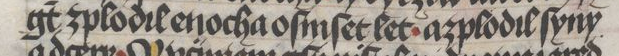ḡt zplodil enocha oſm ſet let. a zplodil ſyny
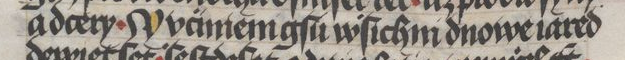a dcery.Y vċínieni gſu wẛichní dnowe iared
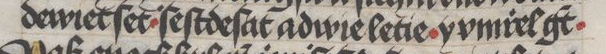dewiet ſet.ẛeſtdeſat a dwíe letie.y vmṙel ḡt.
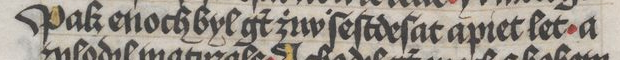Pak enoch byl ḡt żiw ẛeſtdeſat a piet let.a
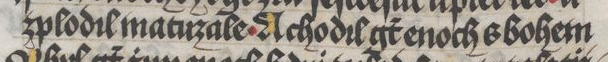zplodil matuzale.A chodil ḡt enoch s bohem
